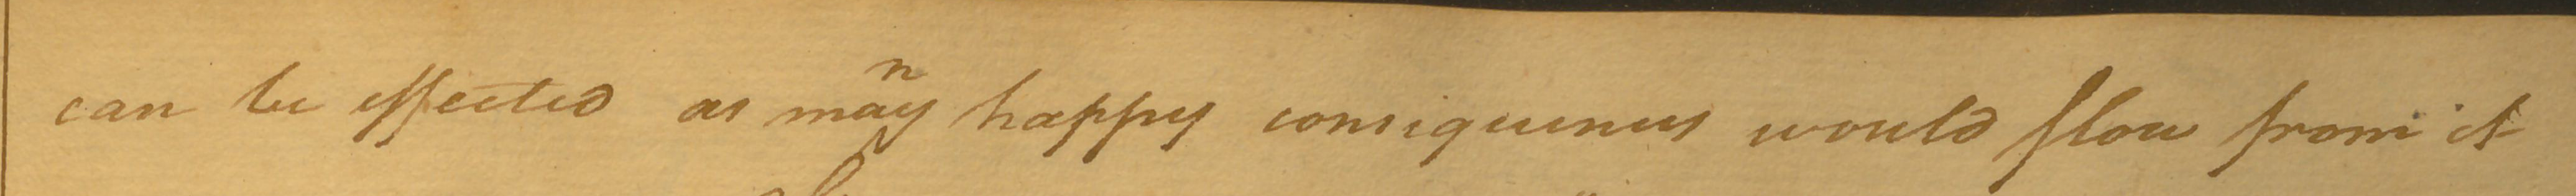can be effected as ma^ny happy consequences would flow from it
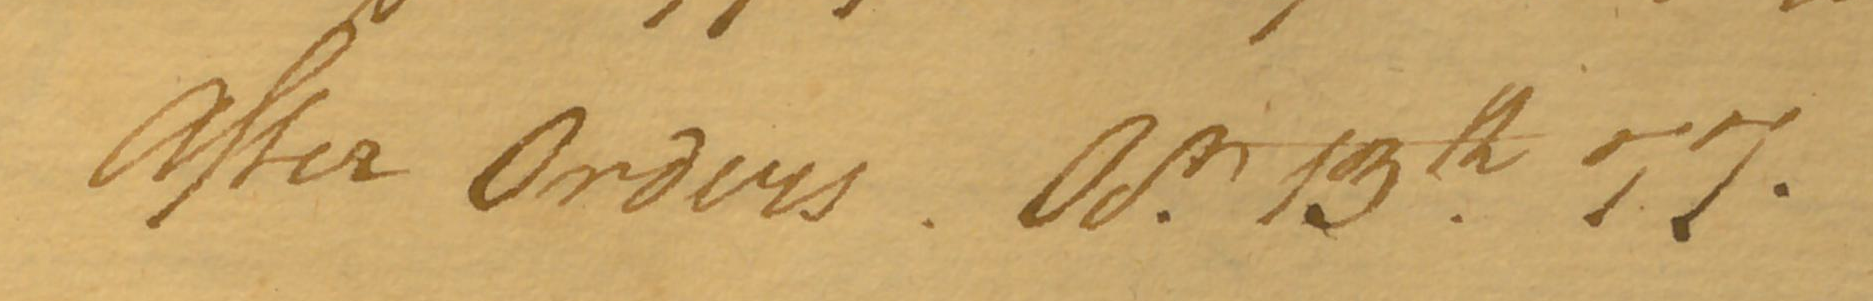After Orders. Oc^r. 13^th. 77.
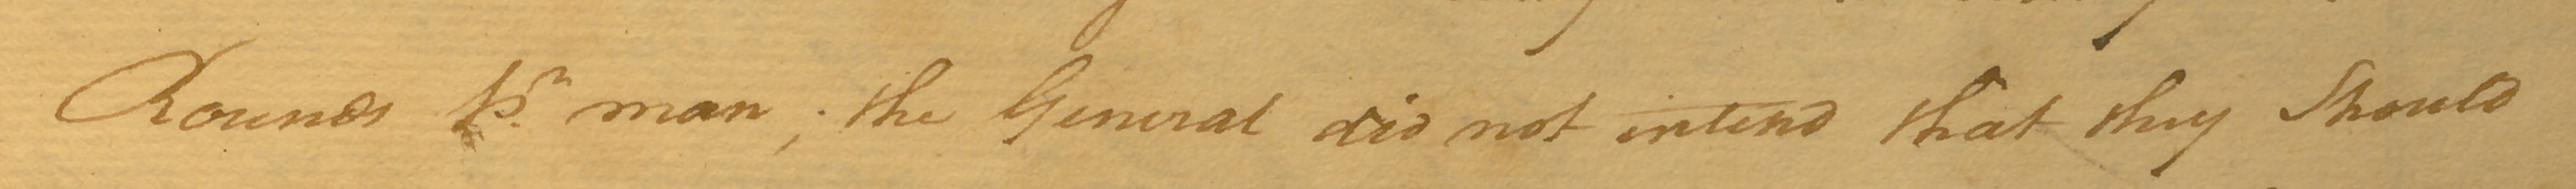Rounds p^r. man; the General did not intend that they should
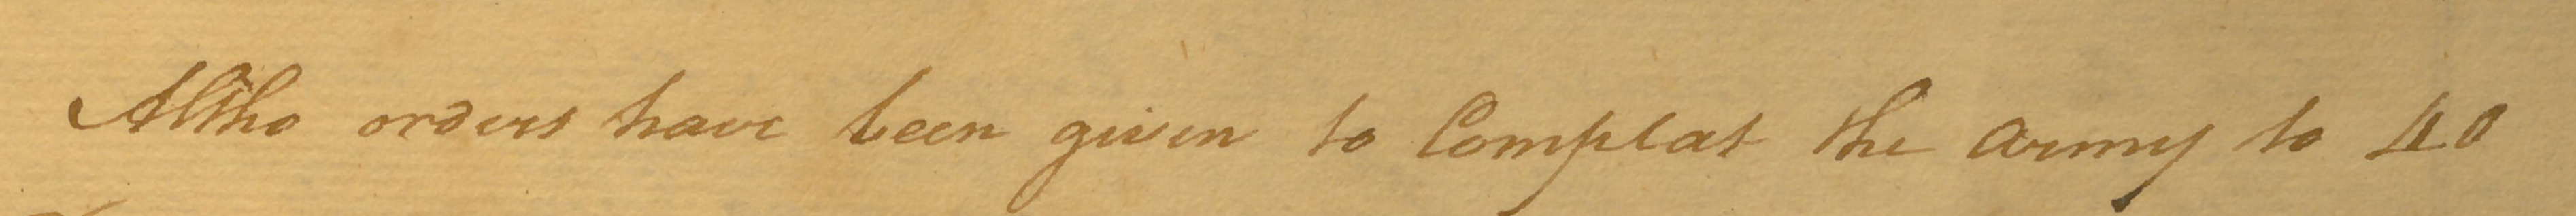Altho orders have been given to Complat the army to 40
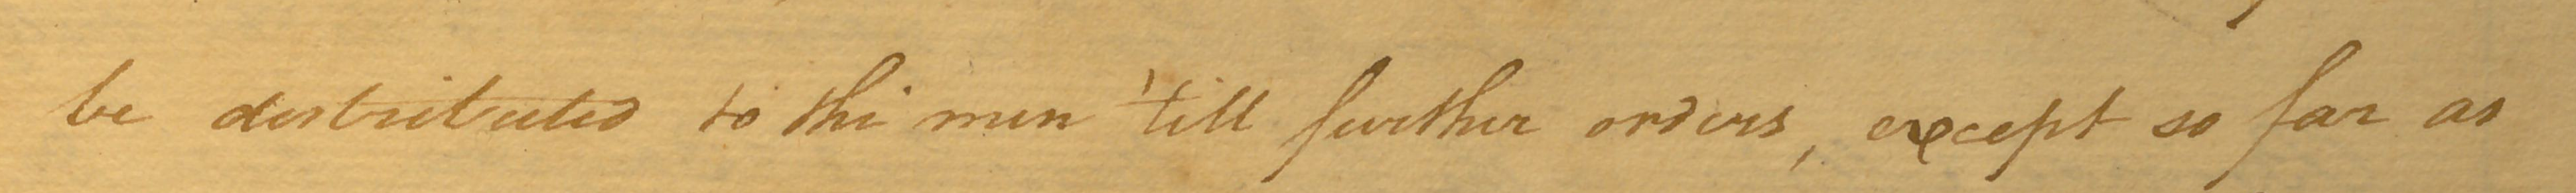be distributed to the men 'till further orders, except so far as
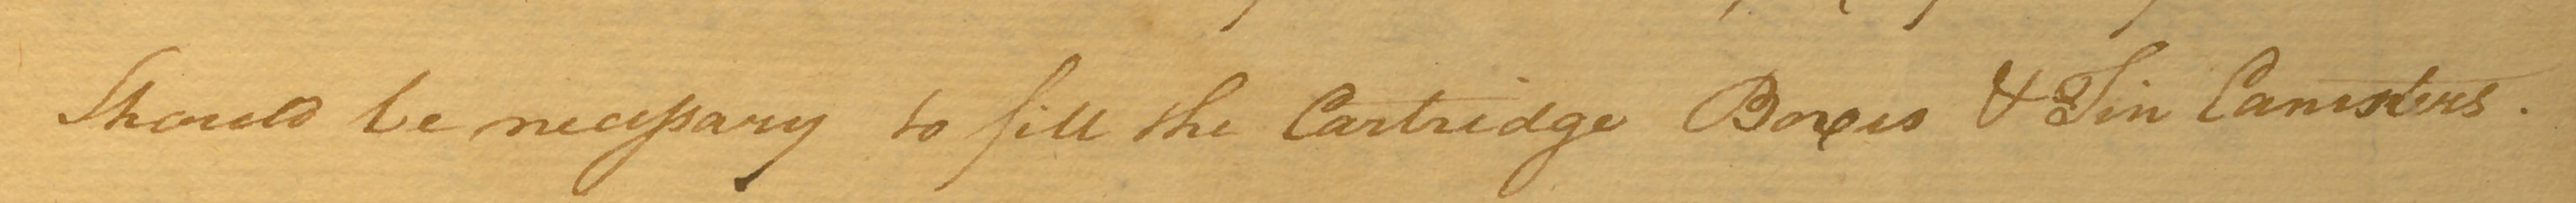should be necessary to fill the Cartridge Boxes & Tin Canisters.
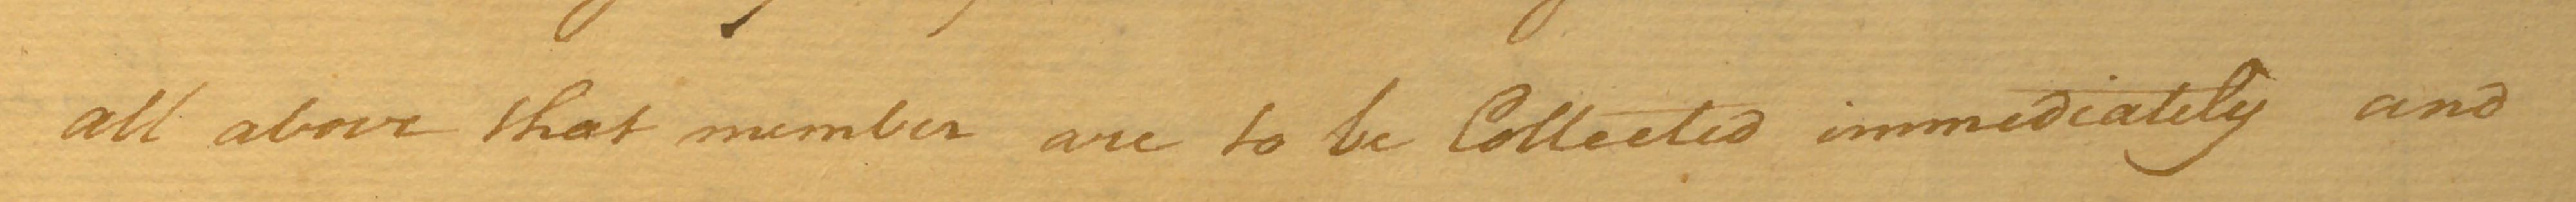all above that number are to be Collected immediately and
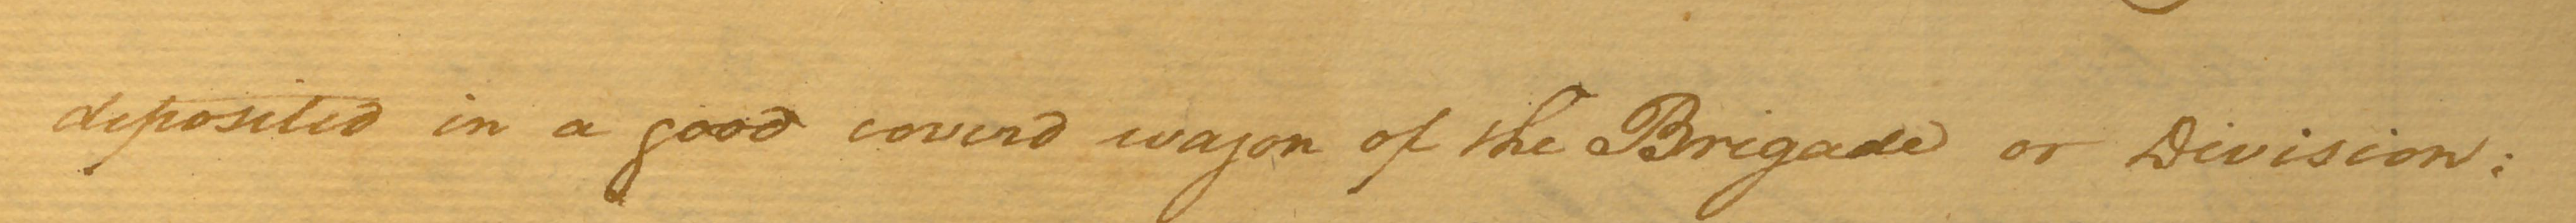deposited in a good coverd wagon of the Brigade or Division:
